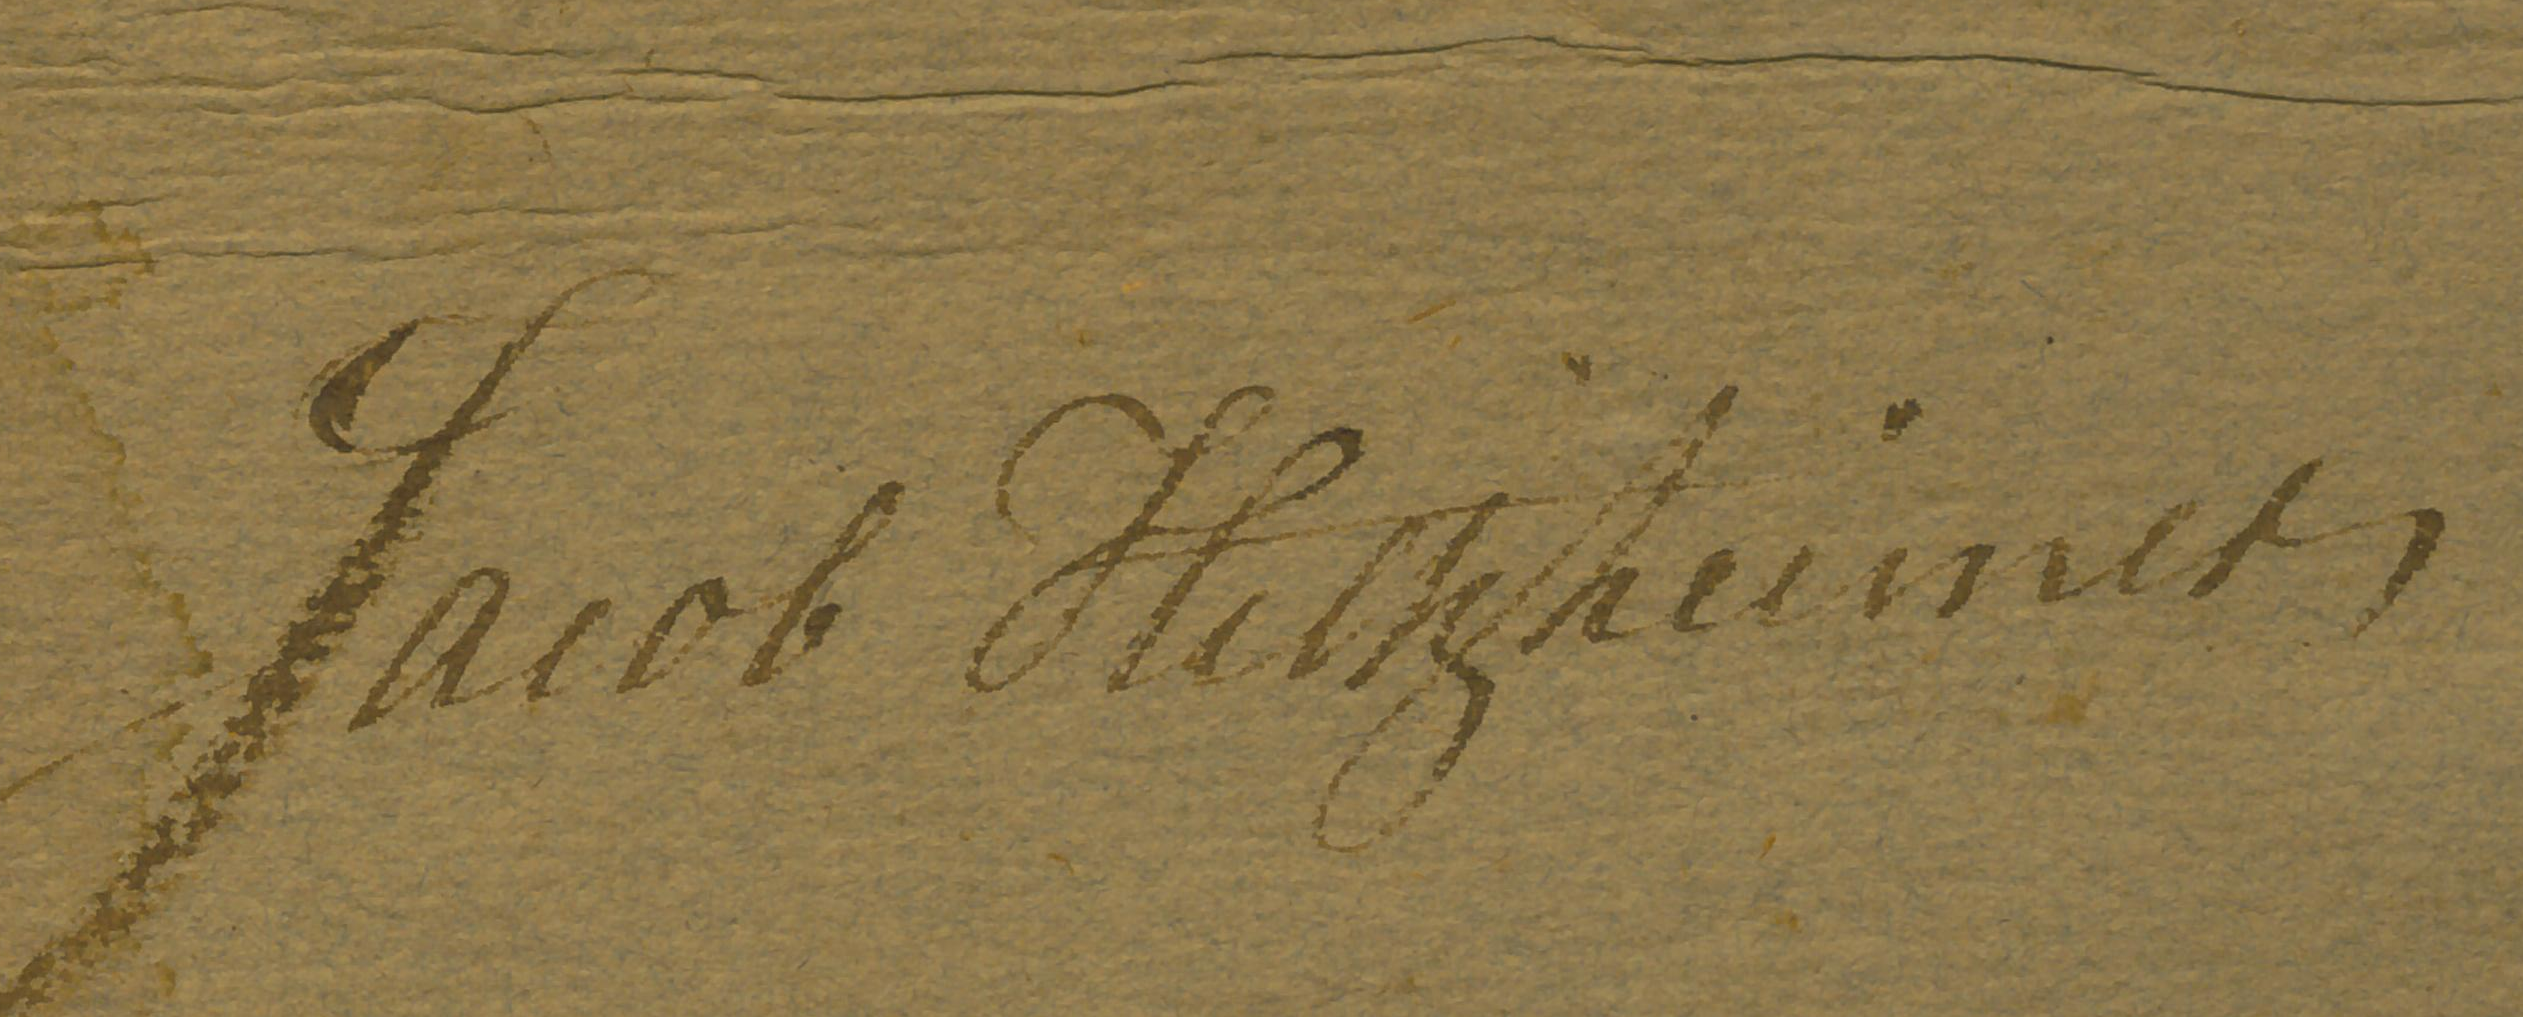Jacob Hiltzheimer
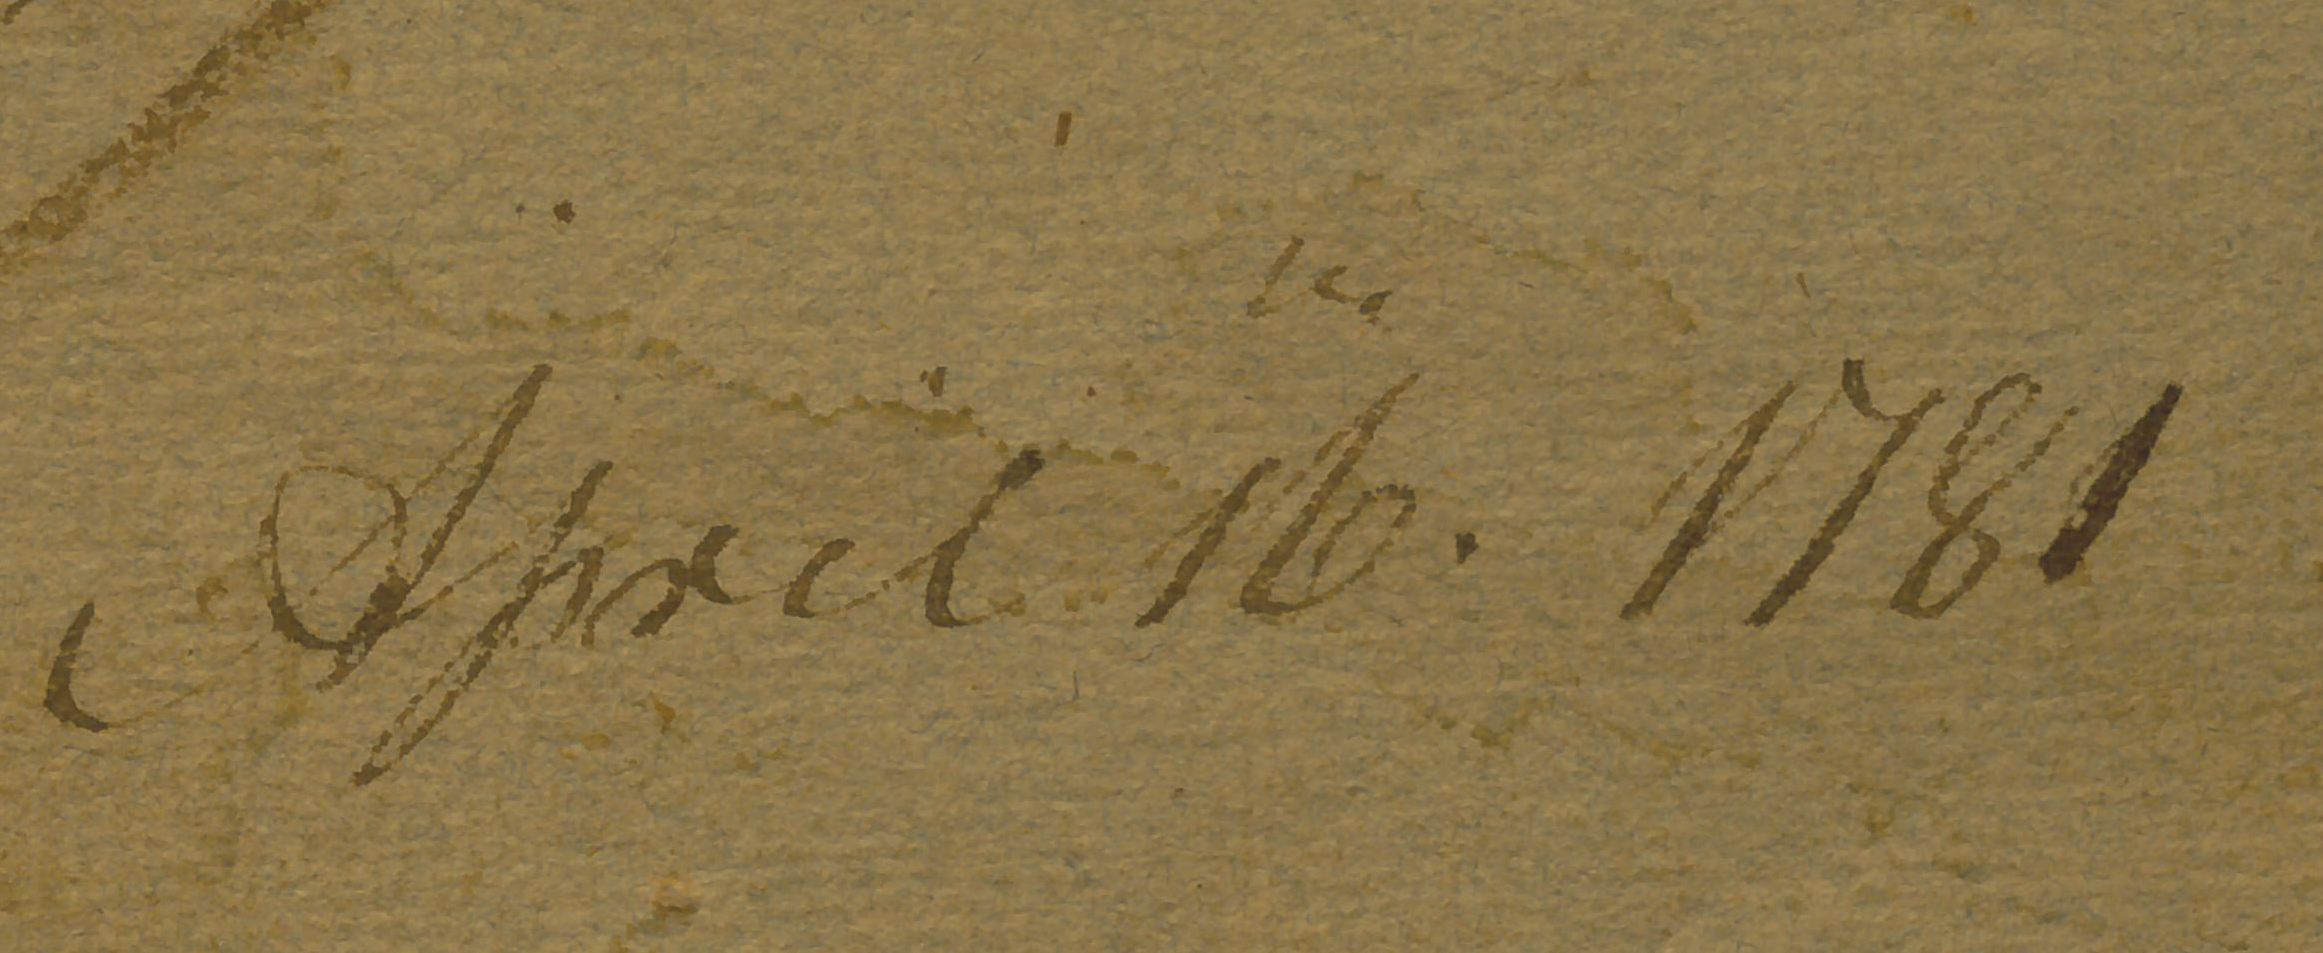April 16. 1781
